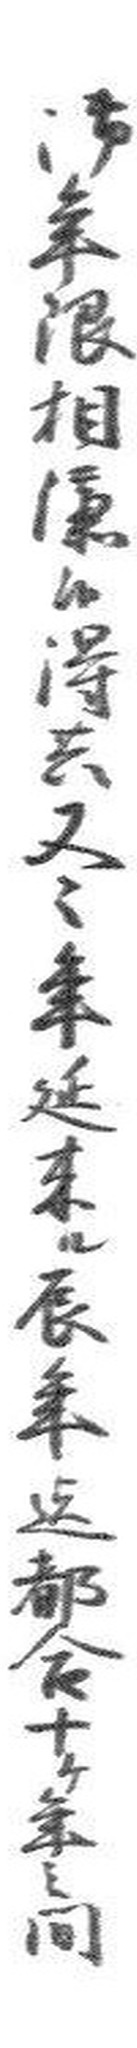御年限相済候得共又々年延来ル辰年迄都合十ヶ年之間
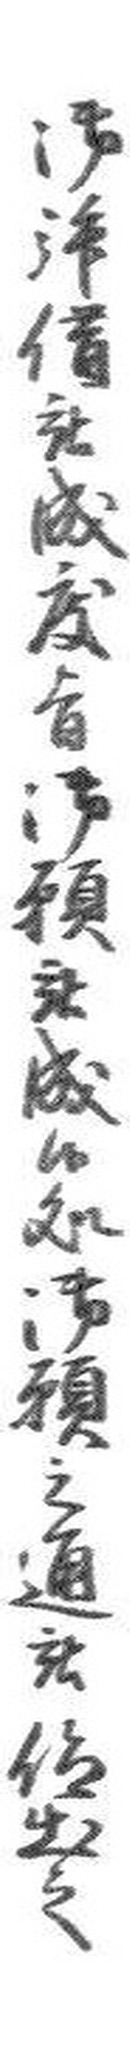御拝借被成度旨御願被成候処御願之通被仰出之
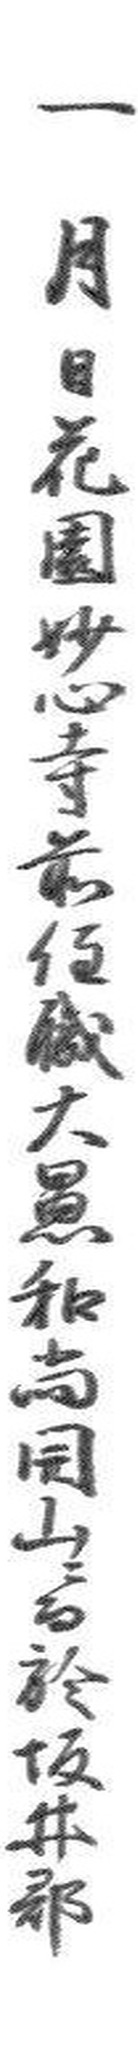一月日花園妙心寺前住職大愚和尚開山ニ而於坂井郡
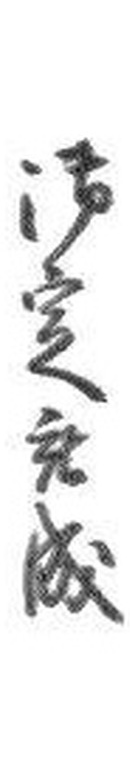御定被成
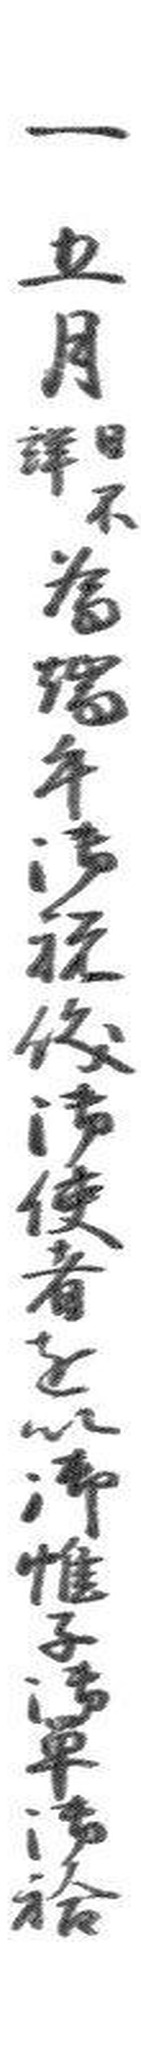一五月日不詳為端午御祝儀御使者を以御帷子御単御袷

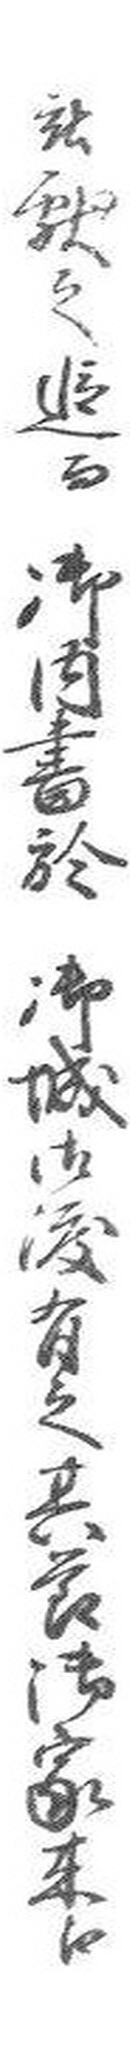被献之追而御内書於御城御渡有之其節御家来江
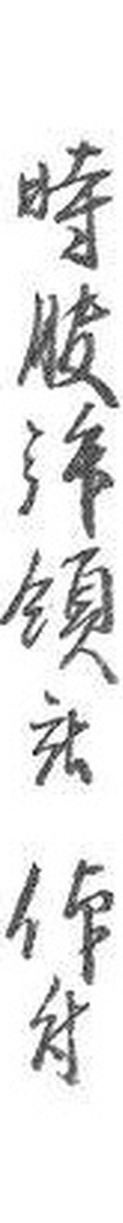時服拝領被仰付
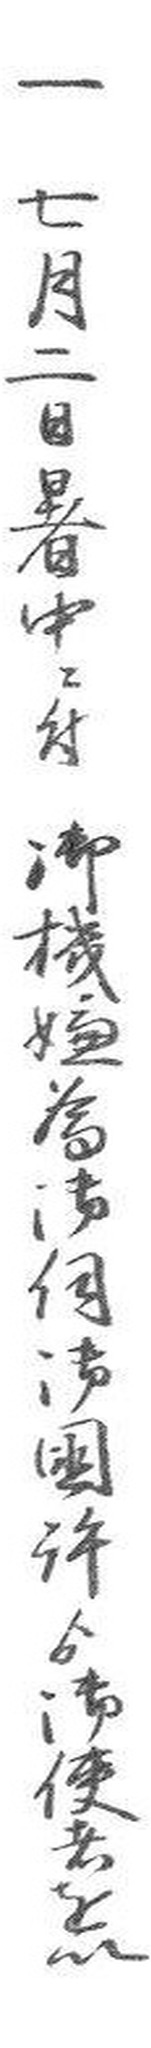一七月二日暑中ニ付御機嫌為御伺御国許ゟ御使者を以
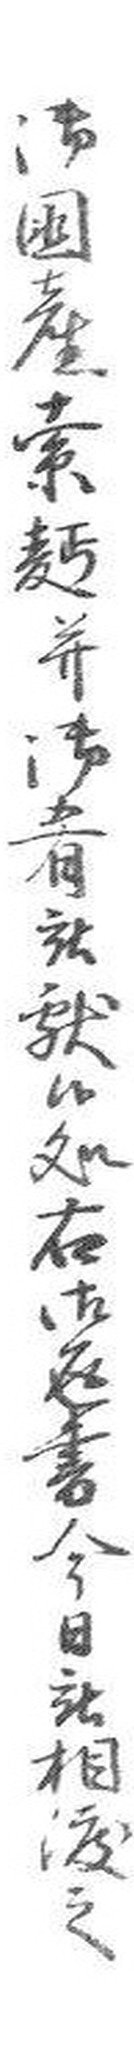御国産索麪并御肴被献候処右御返書今日被相渡之
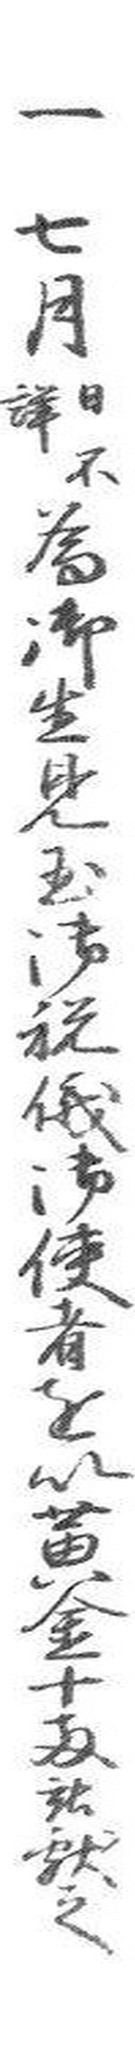一七月日不詳為御生見玉御祝儀御使者を以黄金十両被献之
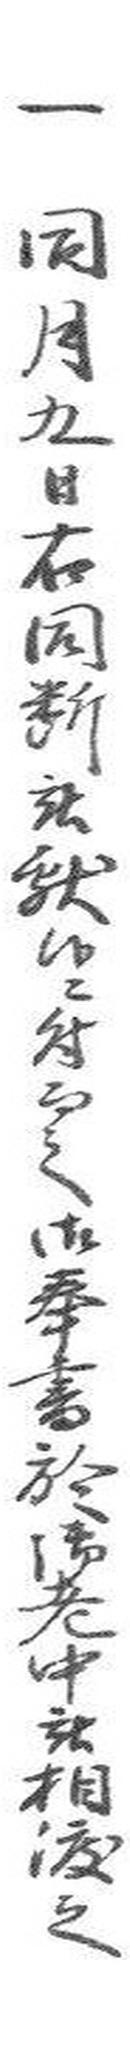一同月九日右同断被献候ニ付而之御奉書於御老中被相渡之
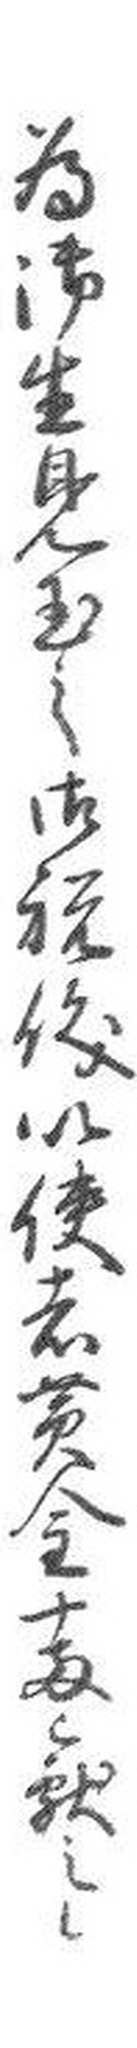為御生見玉之御祝儀以使者黄金十両被献之候
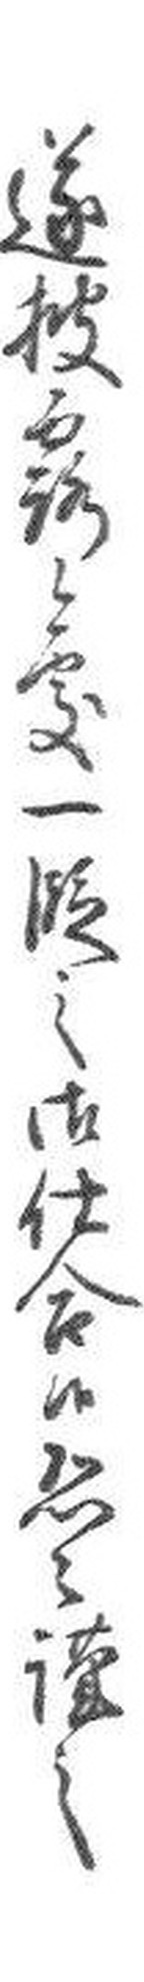遂披露候処一段之御仕合候恐々謹言
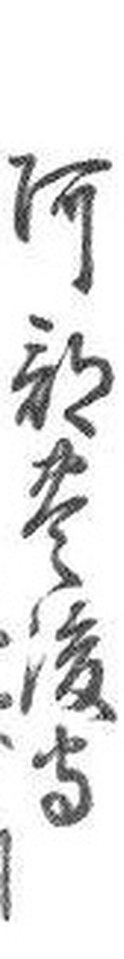阿部豊後守
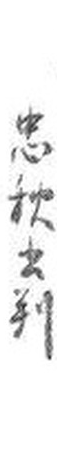忠清書判
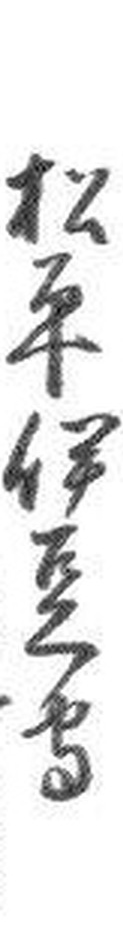松平伊豆守
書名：家譜 五 光通公 従寛永十三年到万治二年
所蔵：福井県文書館 Fukui Prefectural Archives
